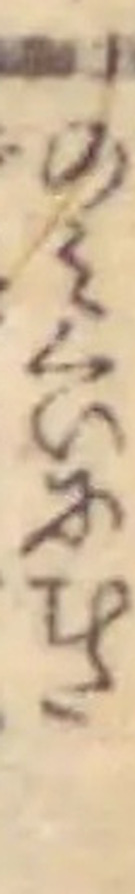のみくいにむた
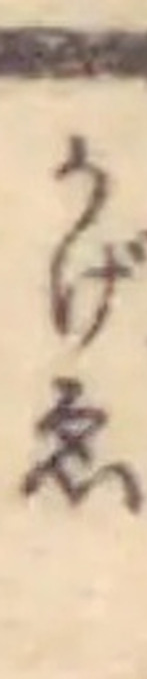かげゑ
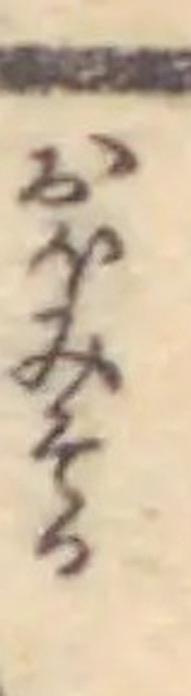おほみそか
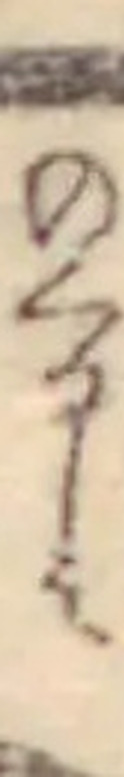のくるしみ
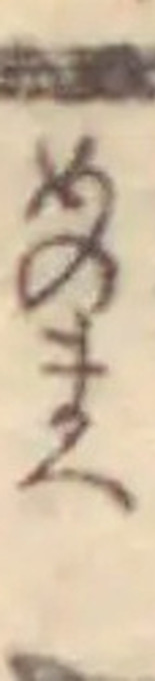めのまへ
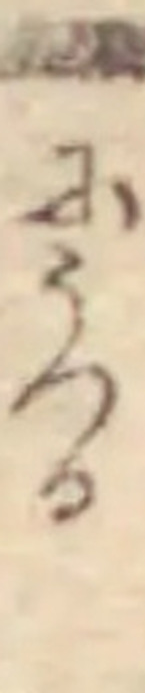にうつる
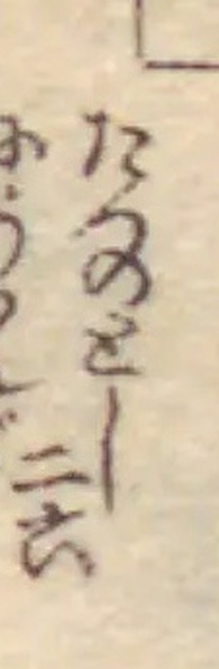たつのとし二六
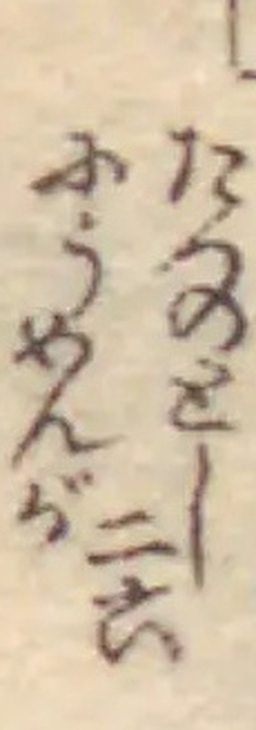にうめんが
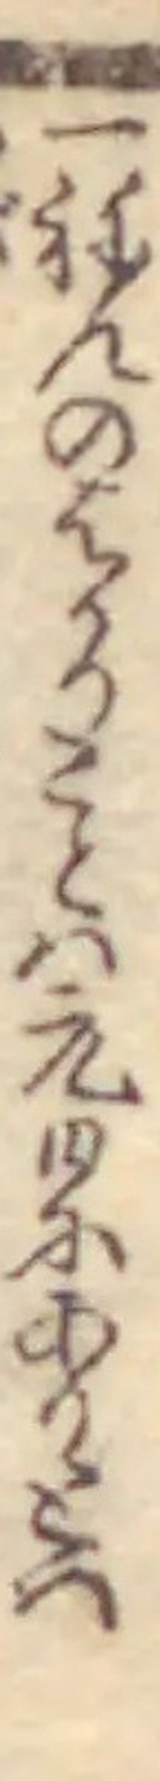一ねんのはかりことは元日にありとは
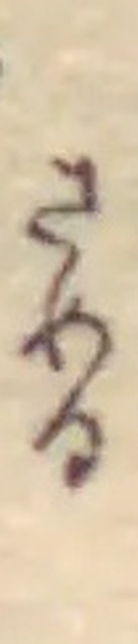さめる
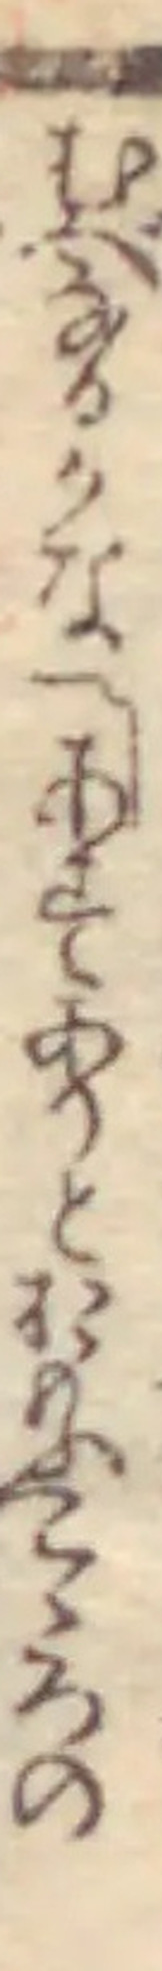むべなるかな乁あすありとおもふこゝろの
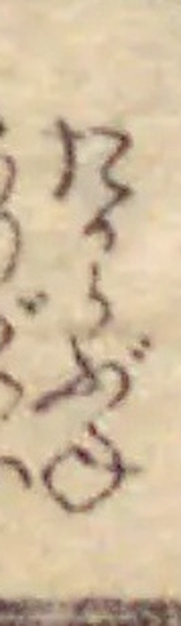たからぶね
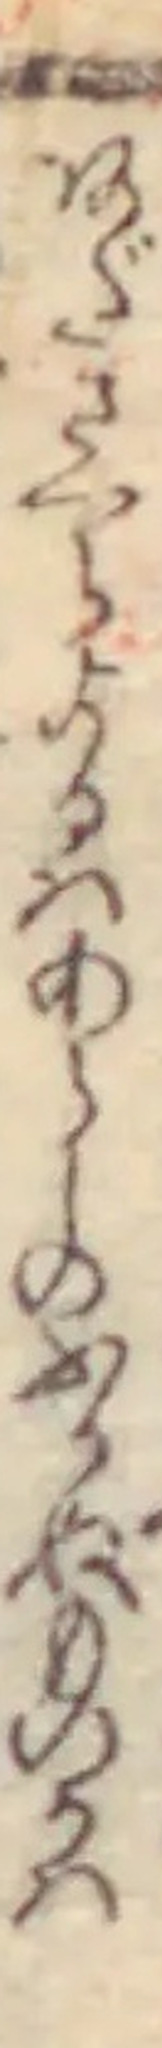あださくらよるはあらしのふかぬものかは
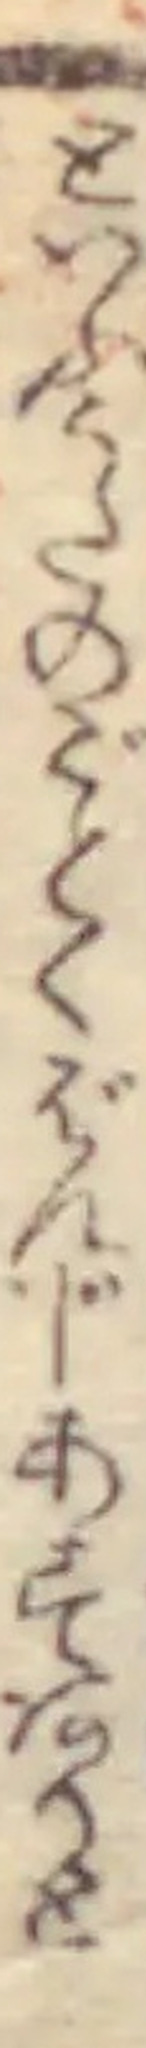といふうたのごとくばんじあすありと
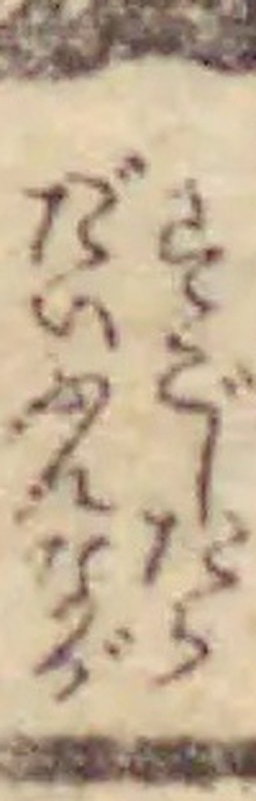だいふんなが
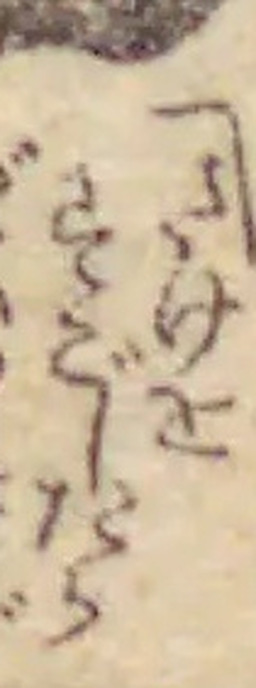すごしたら
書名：児訓影絵喩 3巻
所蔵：国立国会図書館 National Diet Library, JAPAN
